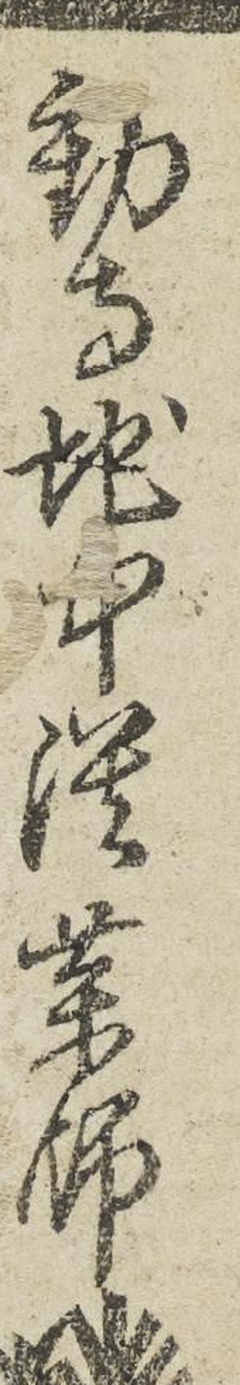勒寺地中潰薬師
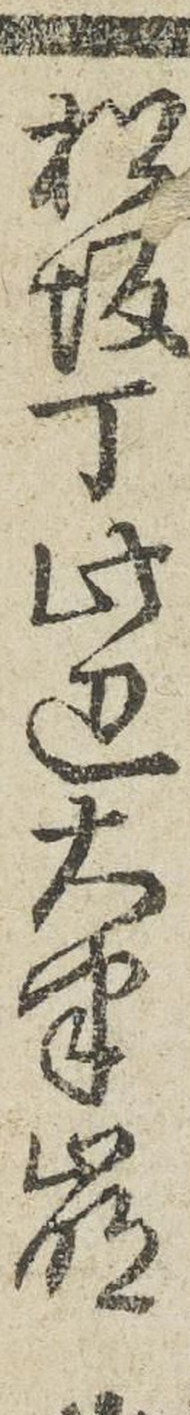松坂丁此辺大半崩
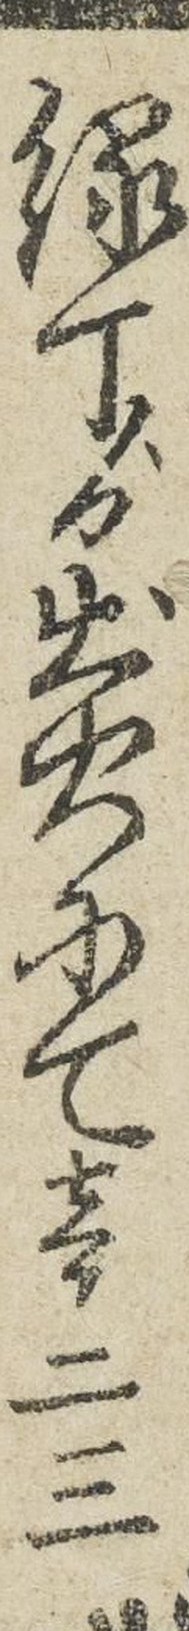緑丁ゟ出火にて壱二三
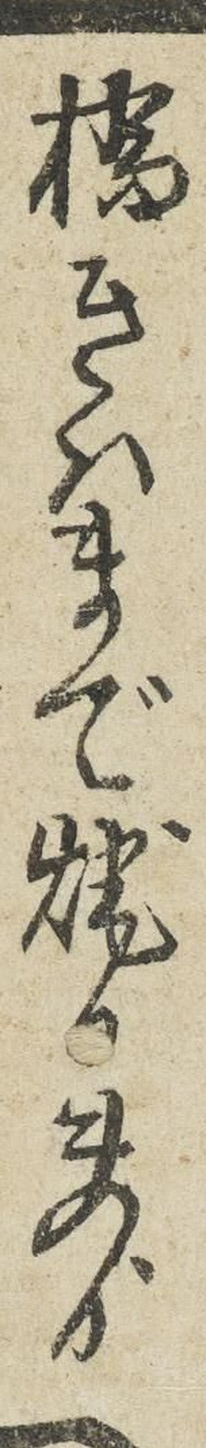橋きはまで焼る夫ゟ
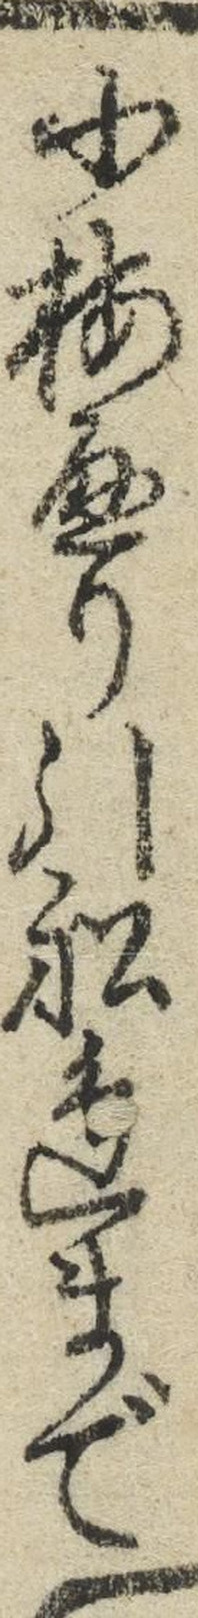小梅通り引船辺まで
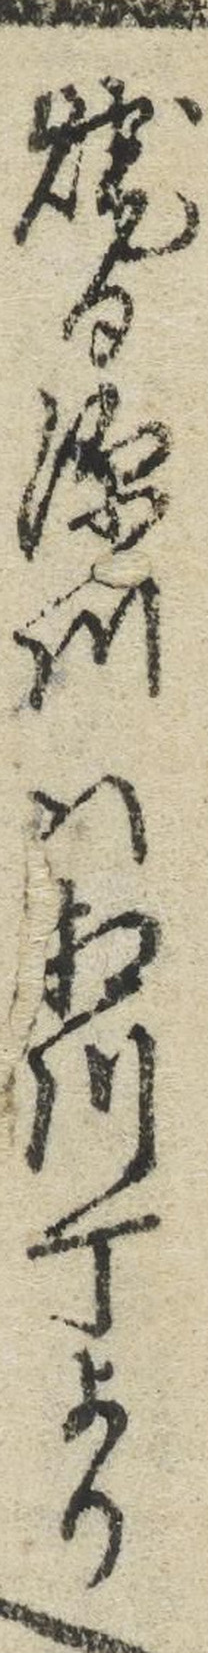焼る深川は相川丁より
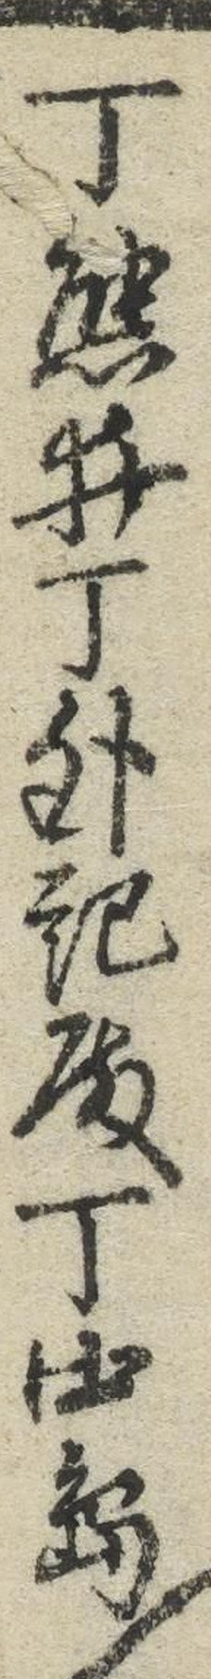丁熊井丁外記殿丁中島
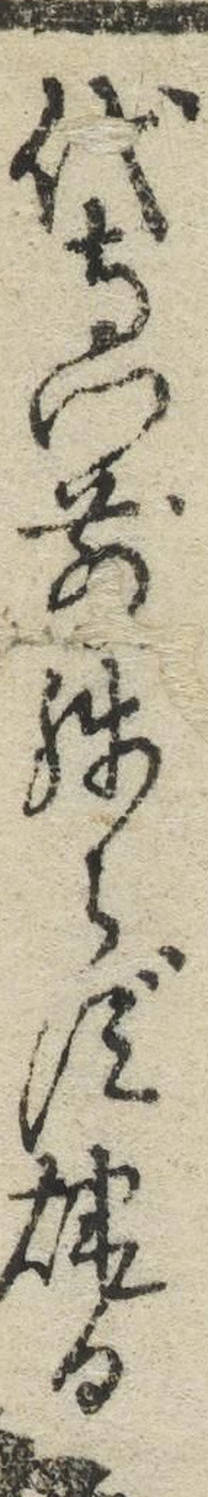代寺門前残らず焼る
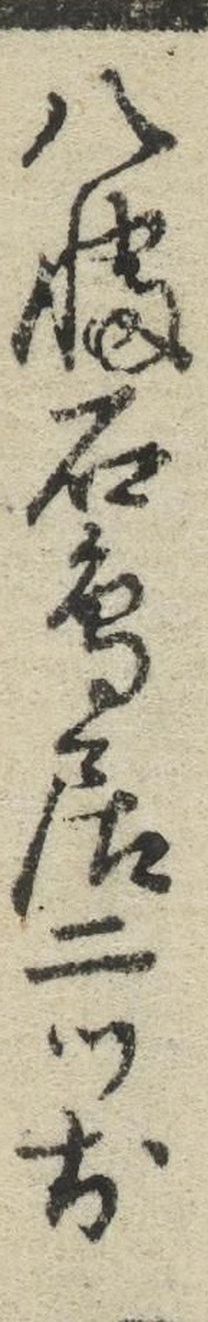八幡石鳥居二ツお
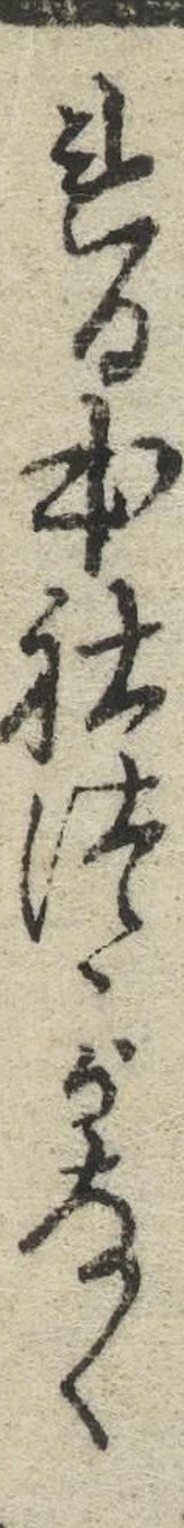れる本社つゝがなく

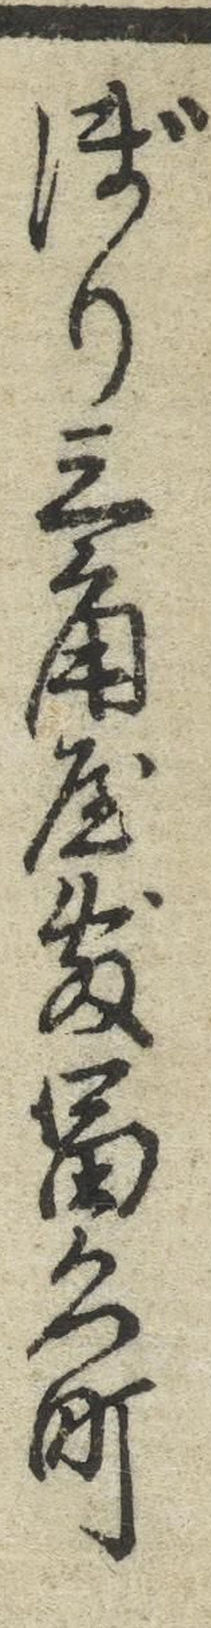ぼり三角屋敷富久町
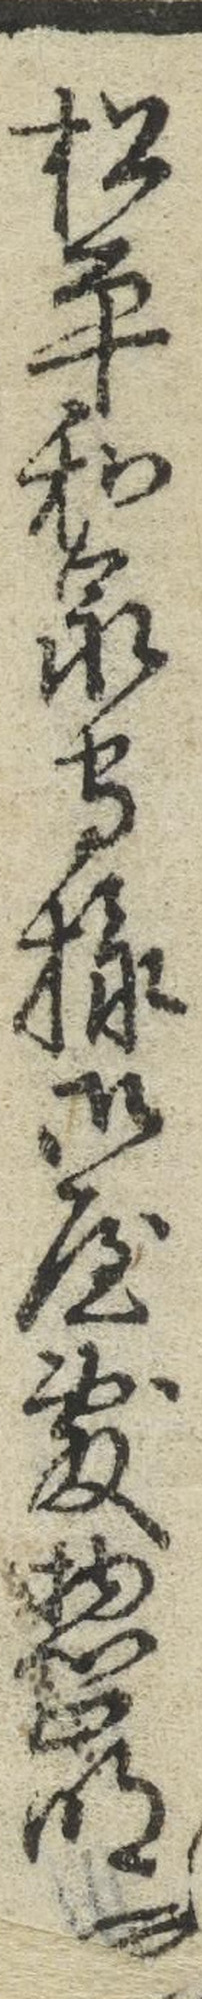松平和泉守様御屋敷惣崩
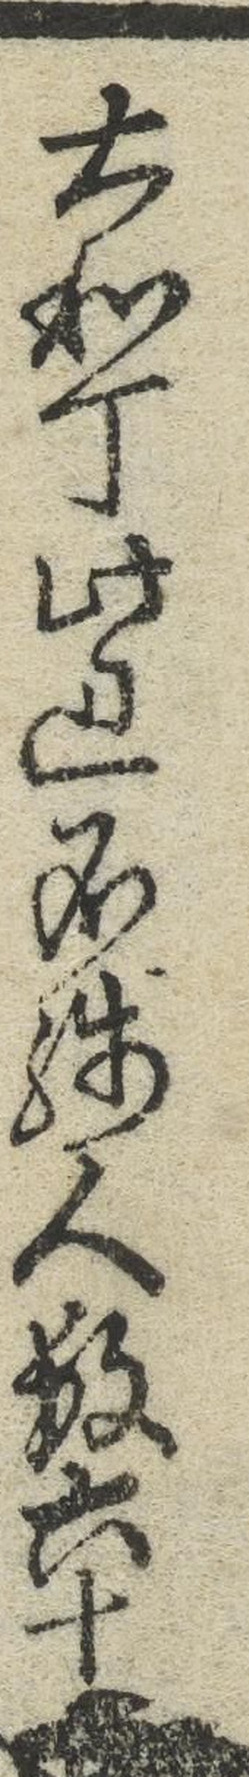大和丁此辺不残人数六十
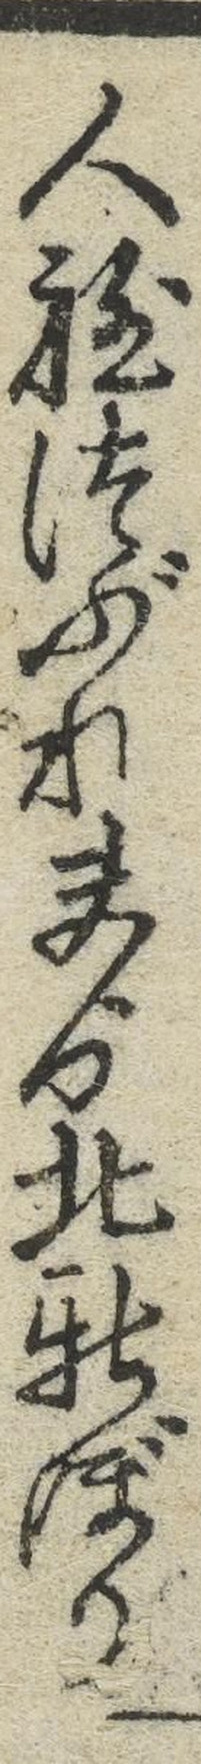人程つぶれ夫ゟ北新ぼり
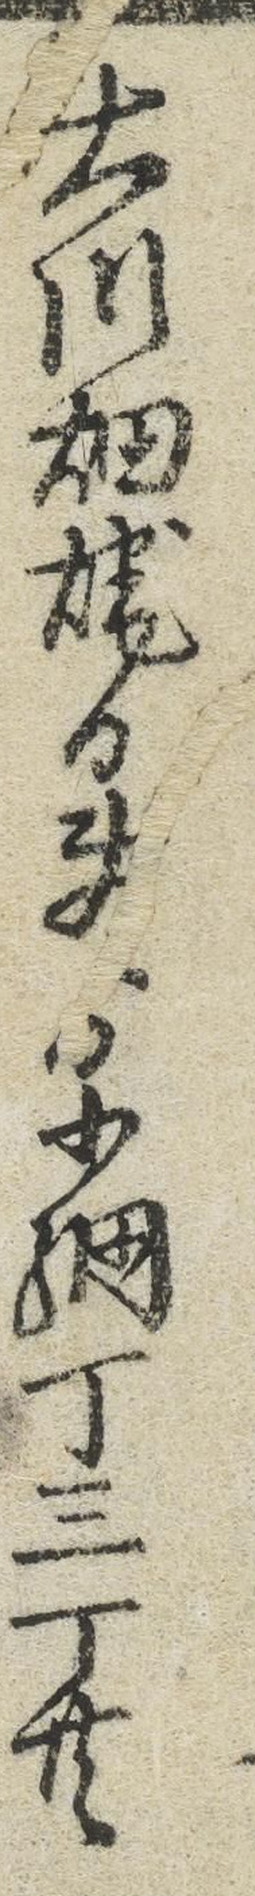大川畑焼る夫ゟ小綱丁三丁共
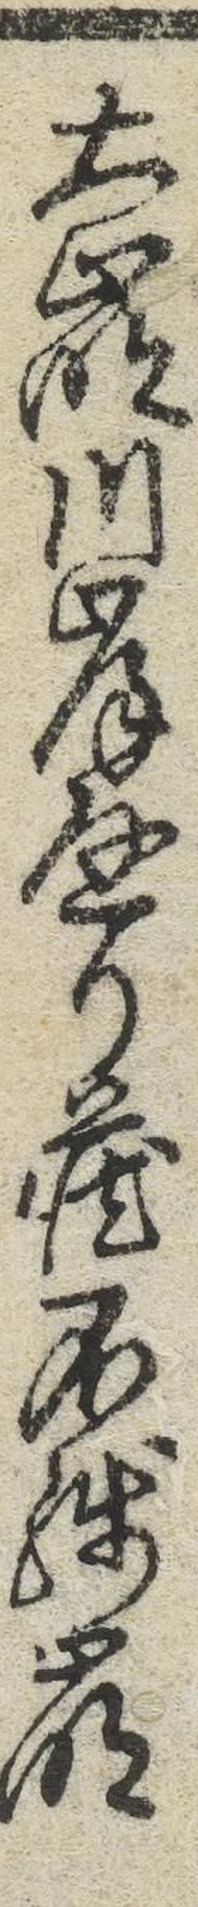大崩川岸通り蔵不残崩
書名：関東五街道　江戸大地震出火場所
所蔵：東京大学地震研究所図書室 Earthquake Research Institute Library, The University of Tokyo, JAPAN
